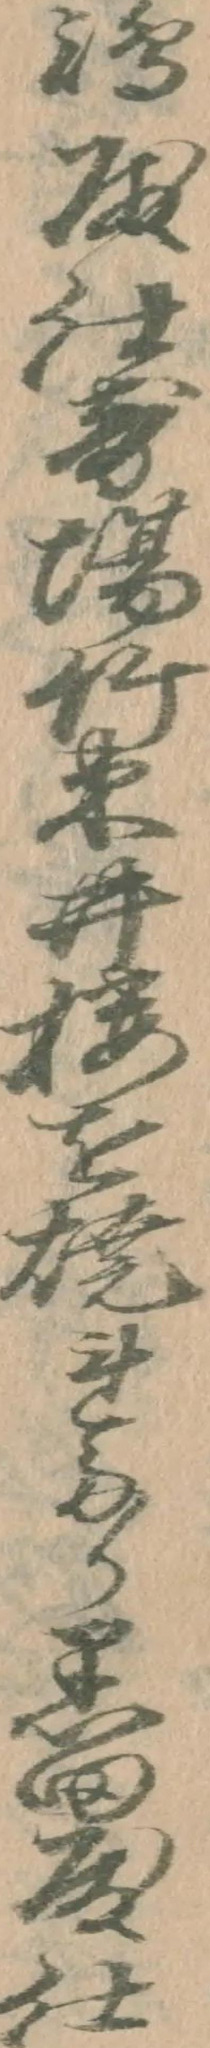島殿仕寄場竹束井樓を焼連多り黒田殿仕
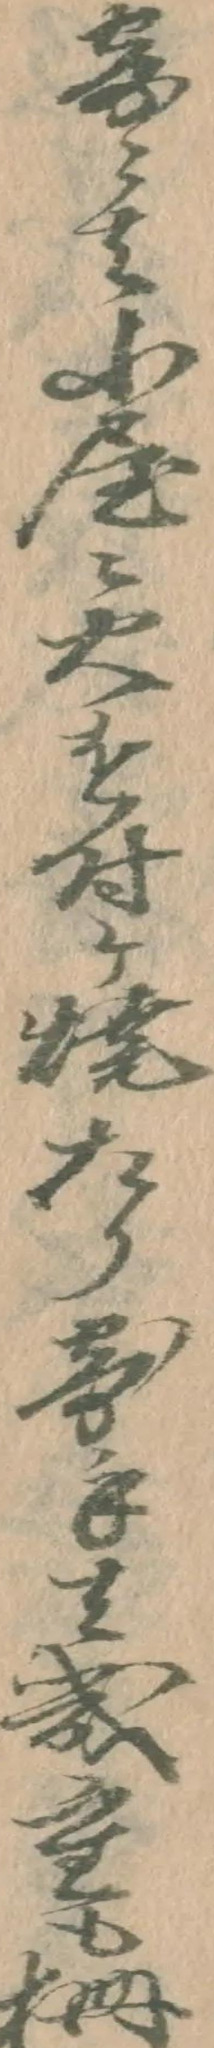寄に者小屋に火を付け焼たり寄手者幾重も柵
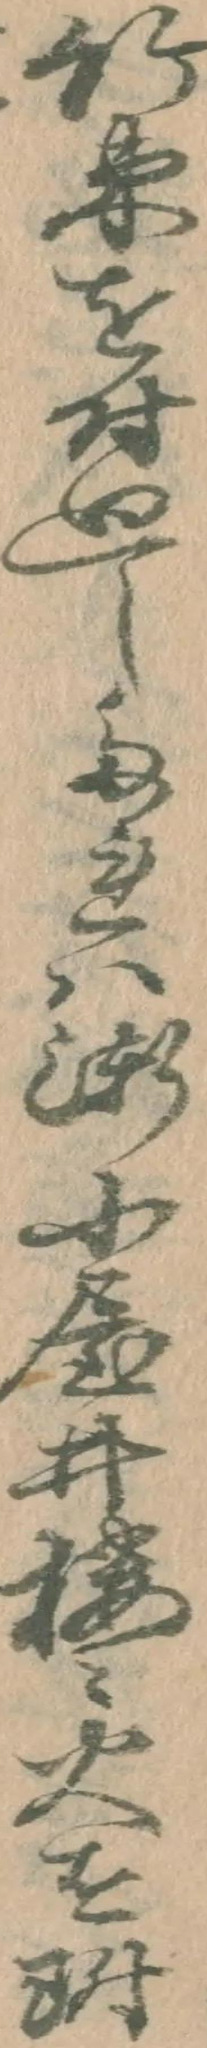竹束を付廻し多連は漸小屋井樓に火を附
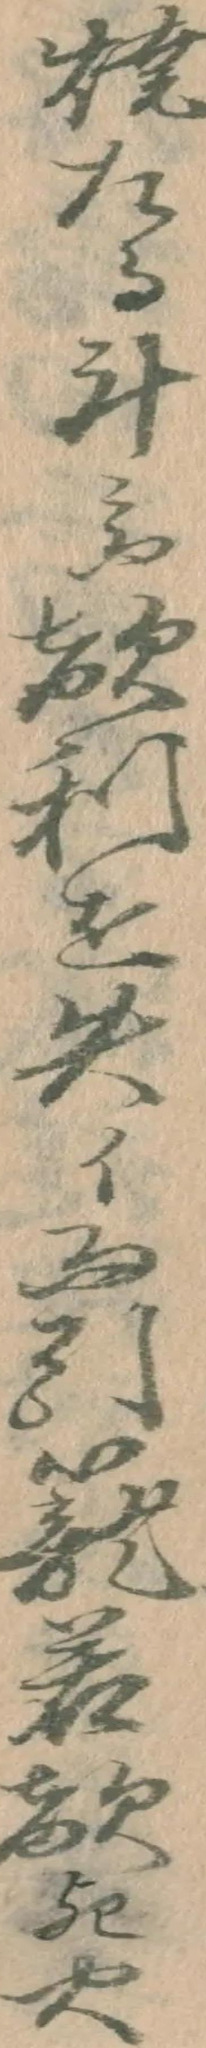焼たる斗に而敵利を失い而引籠若敵歟火
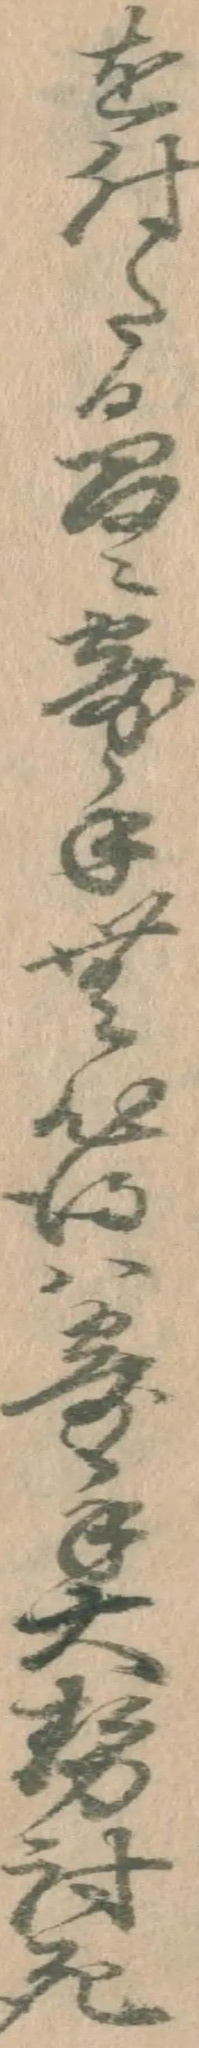を付たる間に寄手無心得は寄手大勢討死
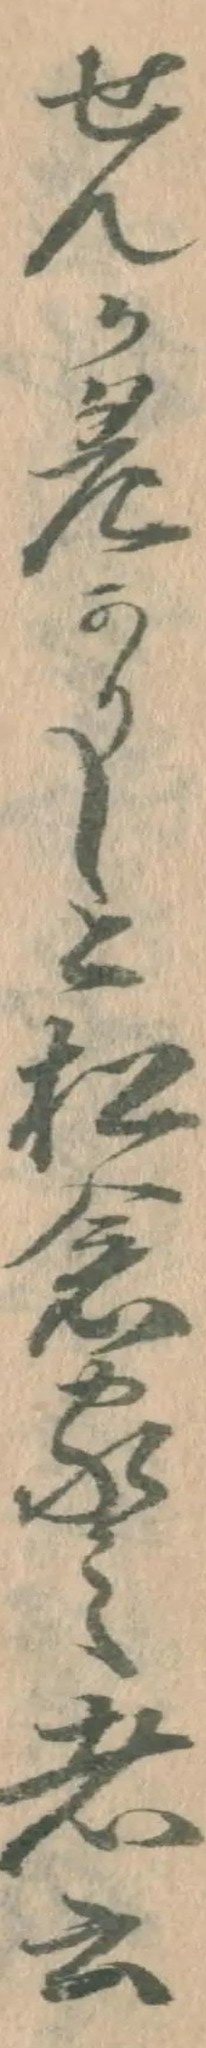せんか差可りしと松倉家之者云
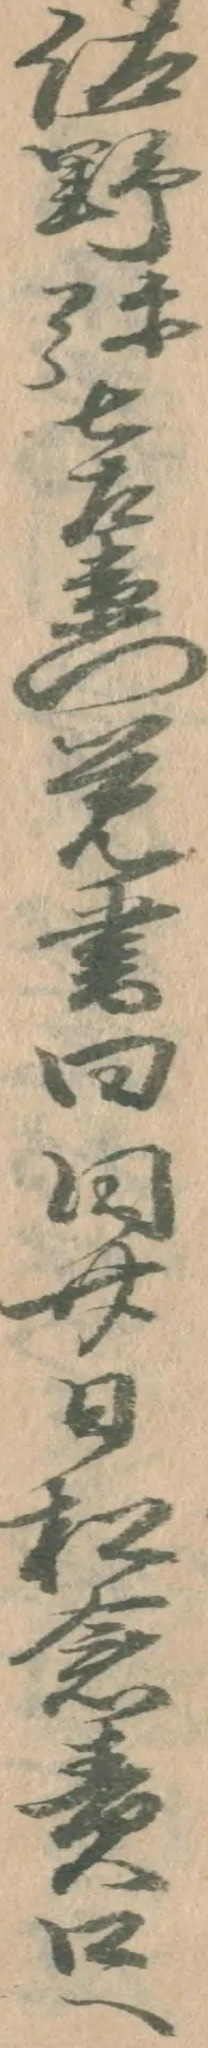佐野弥七左衛門覚書曰同廿日松倉責口へ
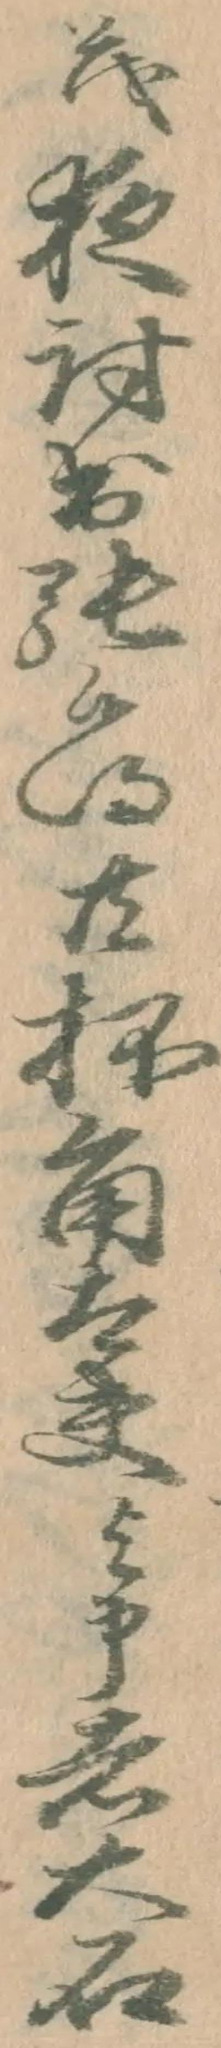茂夜討出張候得共抔角太夫与申者大石

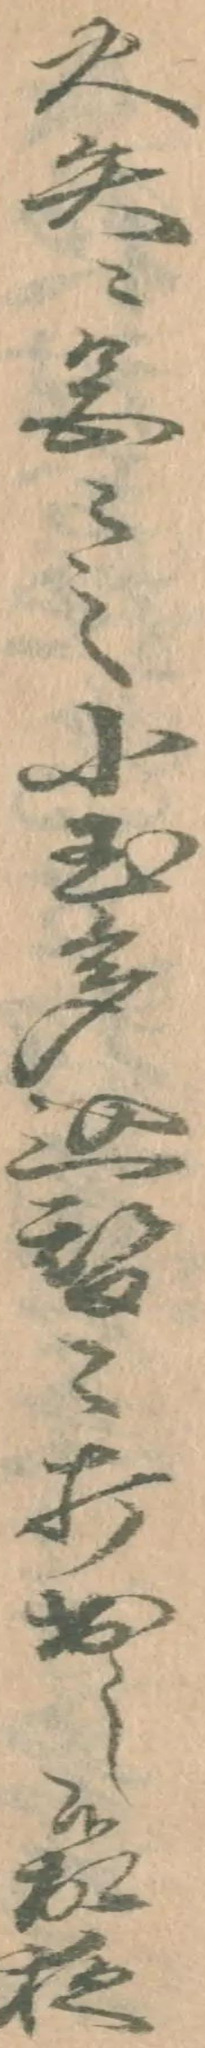火矢に色々之小玉多込替々打出し候故夜
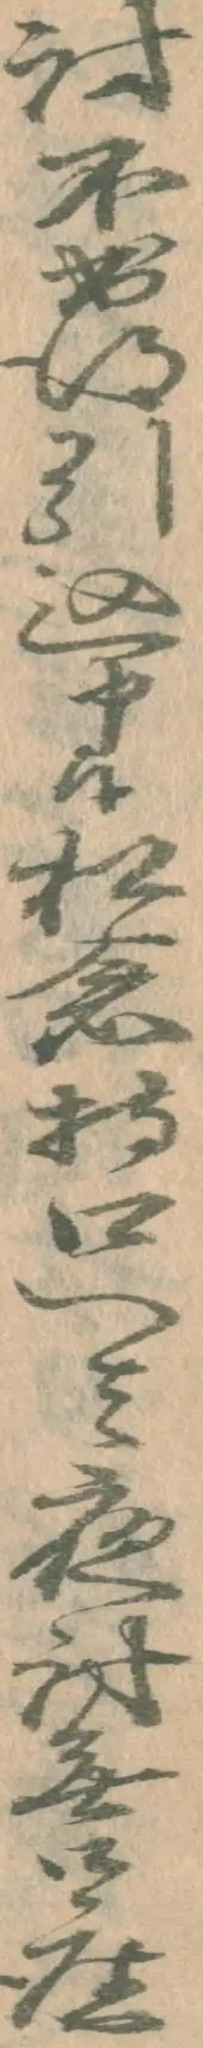討不出得引込申候松倉持口へ者夜討無御座
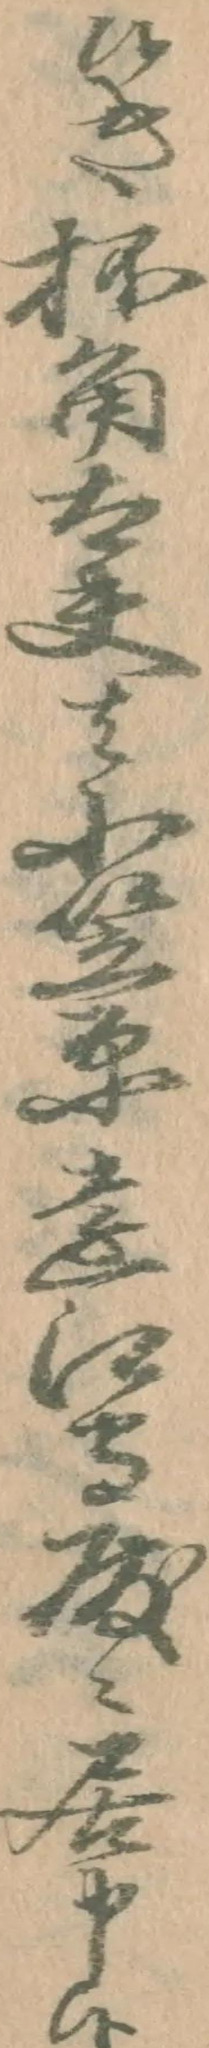候き抔角太夫者小笠原遠江守殿に居申候
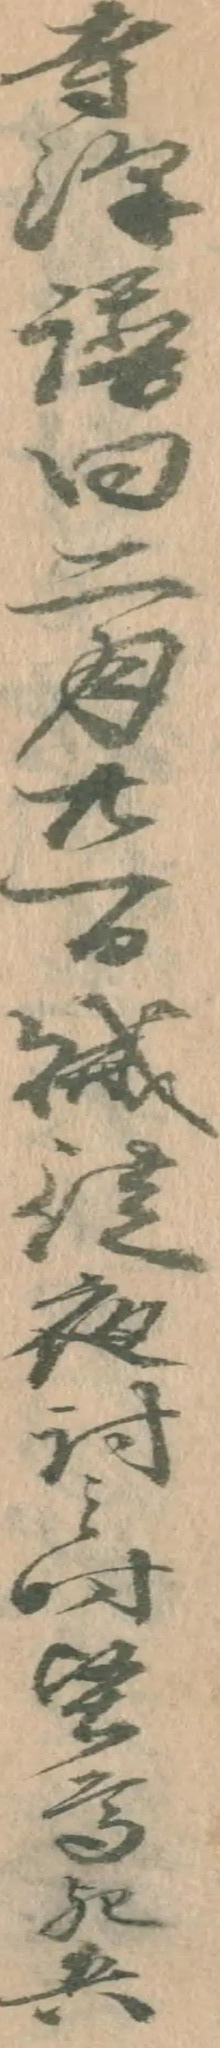寺沢譜曰二月廿一日賊徒夜討之時堅高歟兵
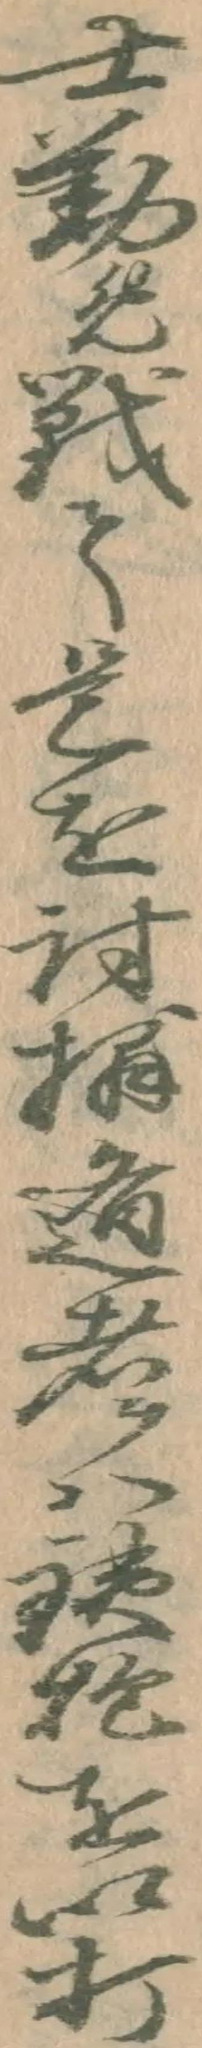し士勤免戦て是を討捕遁者をは鉄炮を以打
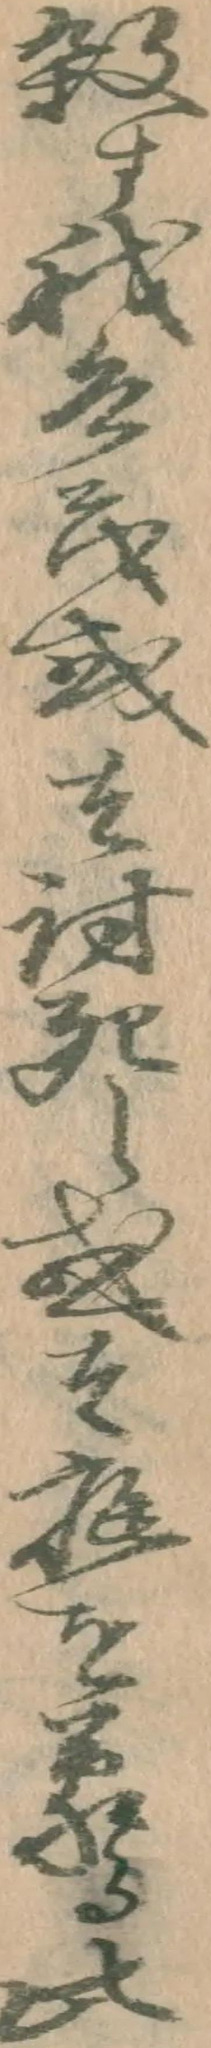殺す我等茂或者討死し或者疵を蒙る此
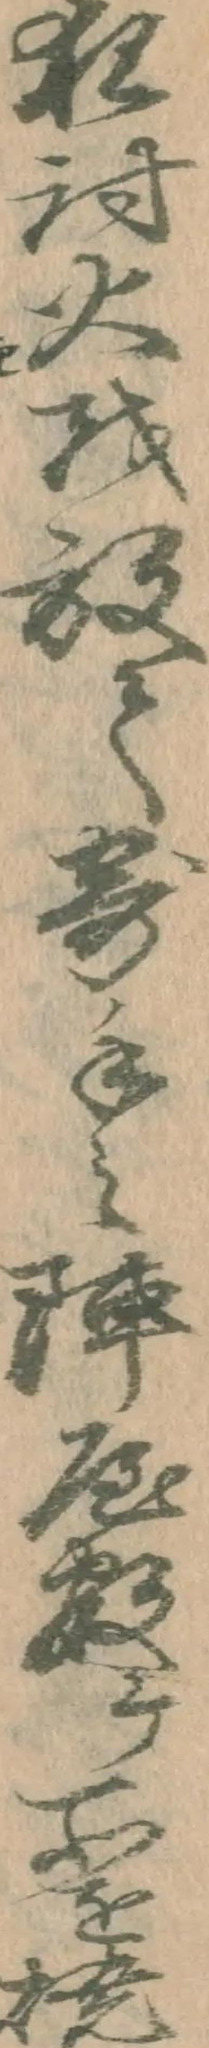夜討火越放て寄手之陣屋数け所を焼
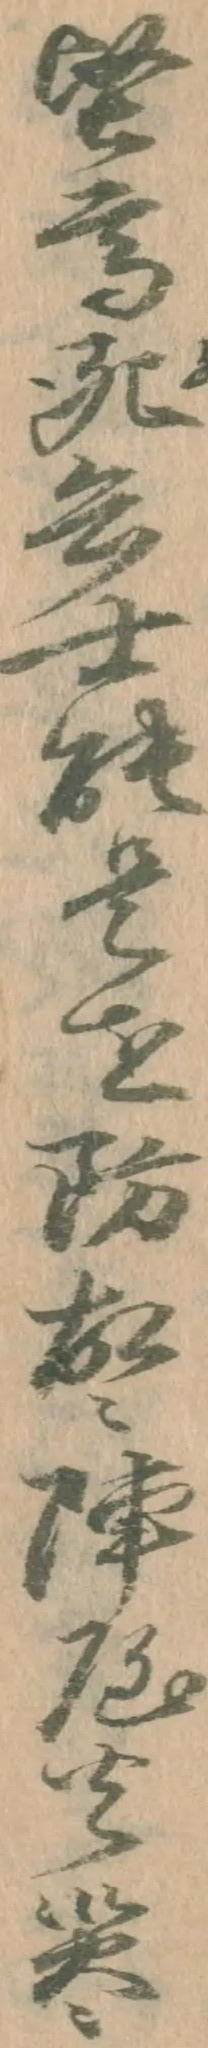堅高歟兵士能是を防故に陣屋火災に
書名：切支丹御退治記 49巻. [7]
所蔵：国立国会図書館 National Diet Library, JAPAN
